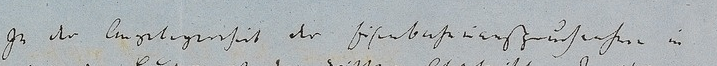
In der Angelegenheit der Eisenbahninanspruchnahme in
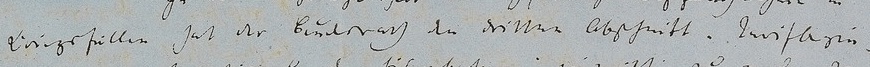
Kriegsfällen hat der Bundesrath den dritten Abschnitt «Tarifbegün-
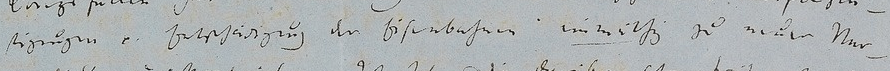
stigungen &. Entschädigung der Eisenbahnen» einmüthig zu neuer Ver-
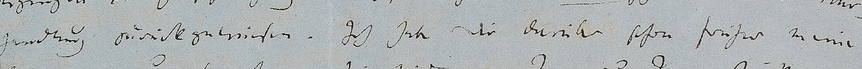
handlung zurückgewiesen. Ich habe Dir darüber schon früher meine
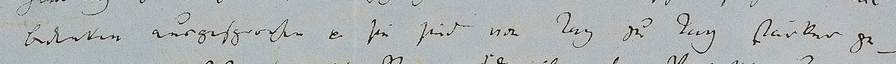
Bedenken ausgeprochen &. sie sind von Tag zu Tag stärker ge-
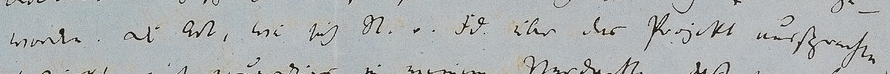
worden. Die Art, wie sich St. &. Fd. über das Projekt aussprachen,
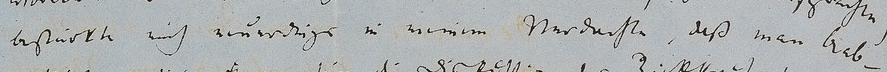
bestärkte mich neuerdings in meinem Verdachte, daß man beab-
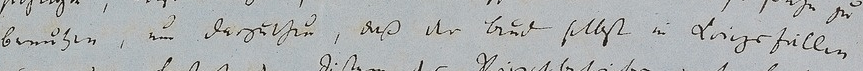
benutzen, um darzuthun, daß der Bund selbst in Kriegsfällen
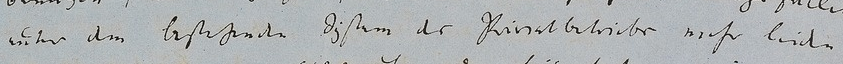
unter dem bestehenden System des Privatbetriebs mehr leiden
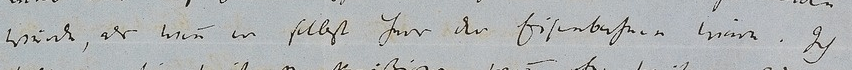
würde, als wenn er selbst Herr der Eisenbahnen wäre. Ich
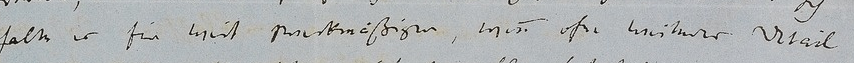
halte es für weit zweckmäßiger, wenn ohne weiteres Detail
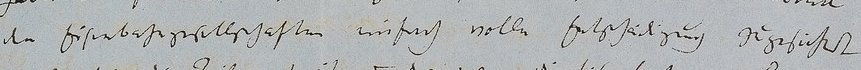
den Eisenbahngesellschaften einfach volle Entschädigung zugesichert
